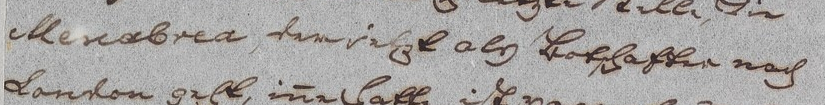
Menabrea, der jetzt als Botschafter nach
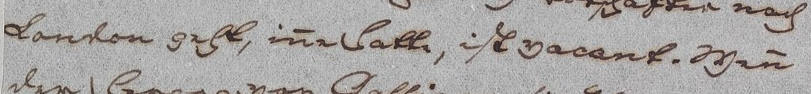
London geht, inne hatte, ist vacant. Wenn
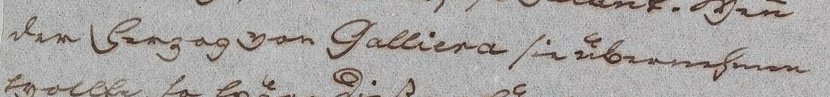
der Herzog von Galliera sie übernehmen
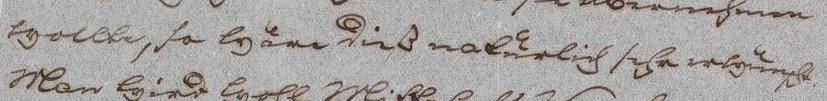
wollte, so wäre dieß natürlich sehr erwünscht.
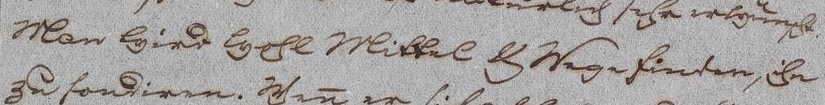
Man wird wohl Mittel & Wege finden, ihn
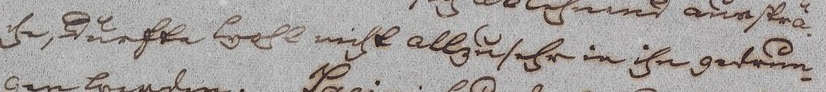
che, dürfte wohl nicht allzusehr in ihn gedrun-
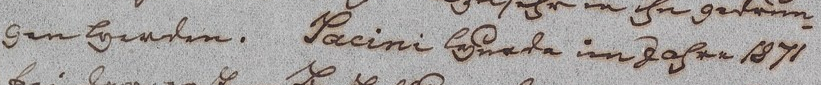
gen werden. Pacini wurde im Jahre 1871
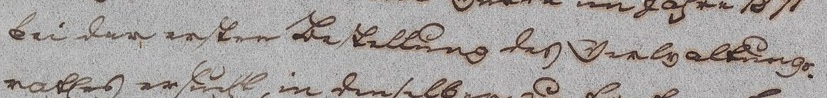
bei der ersten Bestellung des Verwaltungs-
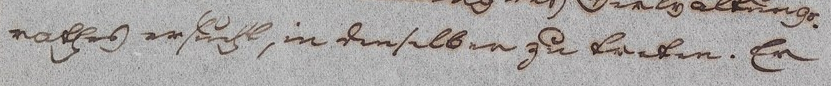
rathes ersucht, in denselben zu treten. Er
